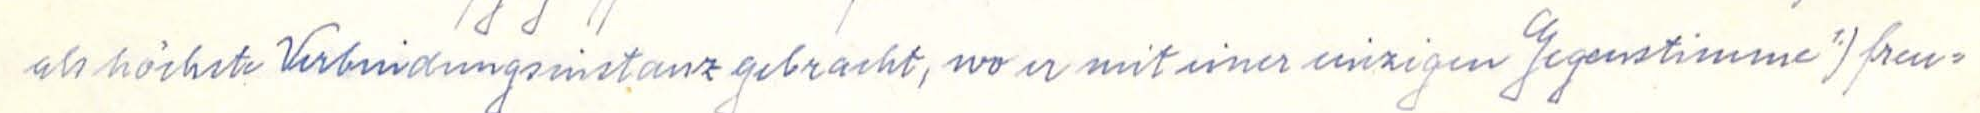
als höchste Verbindungsinstanz gebracht, wo er mit einer einzigen Gegenstimme 1.) freu-
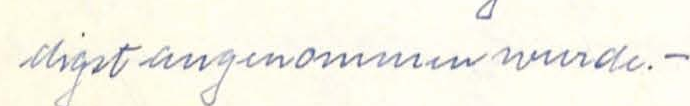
digst angenommen wurde.
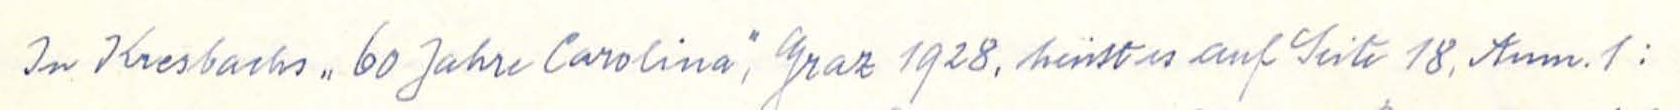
In Kresbachs "60 Jahre Carolina", Graz 1928, heisst es auf Seite 18, Anm. 1:
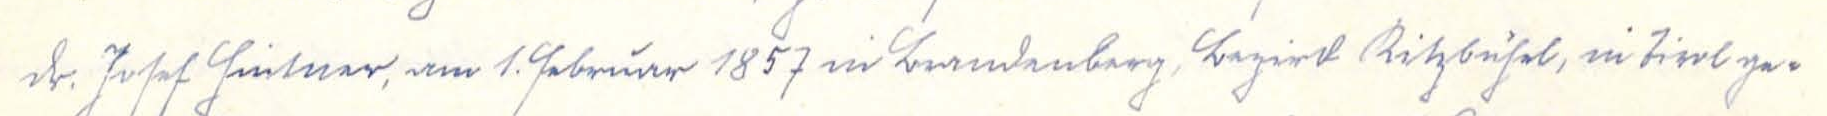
Dr. Josef Hintner, am 1. Februar 1857 in Brandenberg, Bezirk Kitzbühel, in Tirol ge-
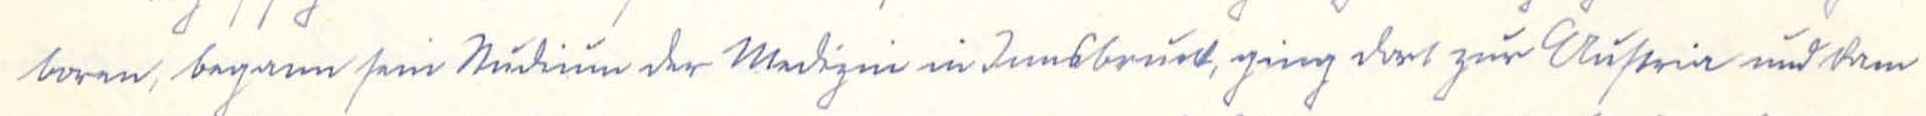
boren, begann sein Studium der Medizin in Innsbruck, ging dort zur Austria und kam
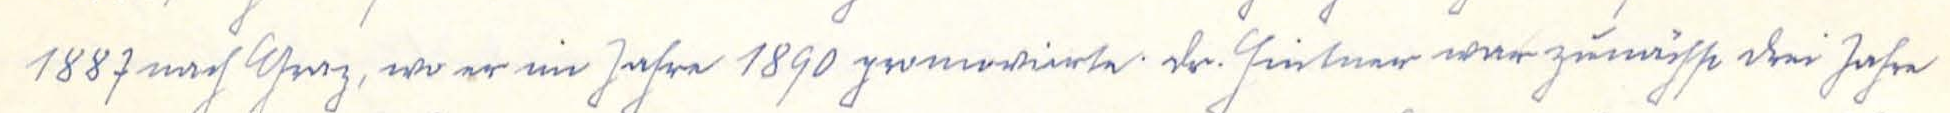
1887 nach Graz, wo er im Jahre 1890 promovierte. Dr. Hintner war zunächst drei Jahre
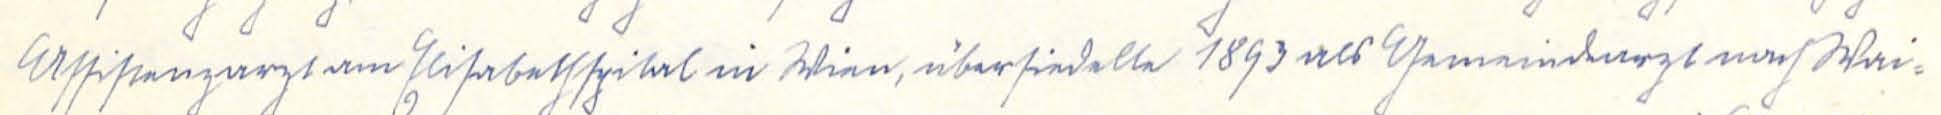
Assistenzarzt am Elisabethspital in Wien, übersiedelte 1893 als Gemeindearzt nach Wai-
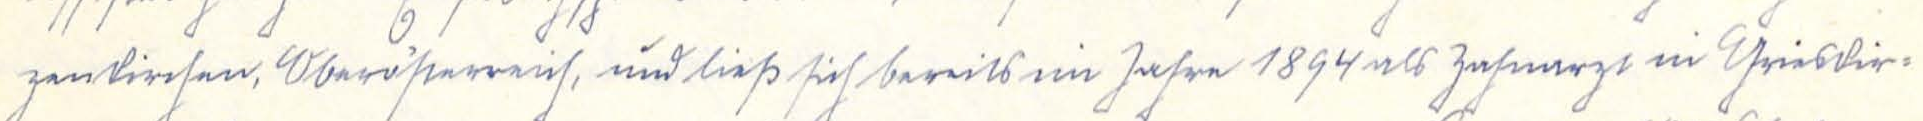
zenkirchen, Oberösterreich, und ließ sich bereits im Jahre 1894 als Zahnarzt in Grieskir-
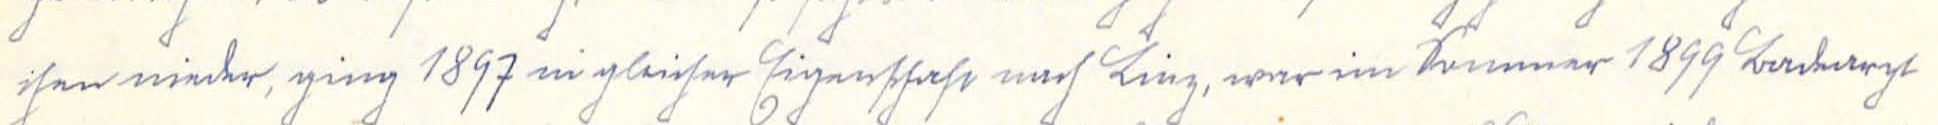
chen nieder, ging 1897 in gleicher Eigenschaft nach Linz, war im Sommer 1899 Facharzt
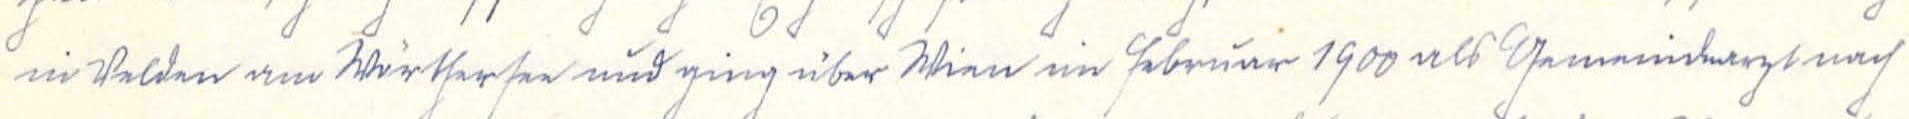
in Velden am Wörthersee und ging über Wien im Februar 1900 als Gemeindearzt nach
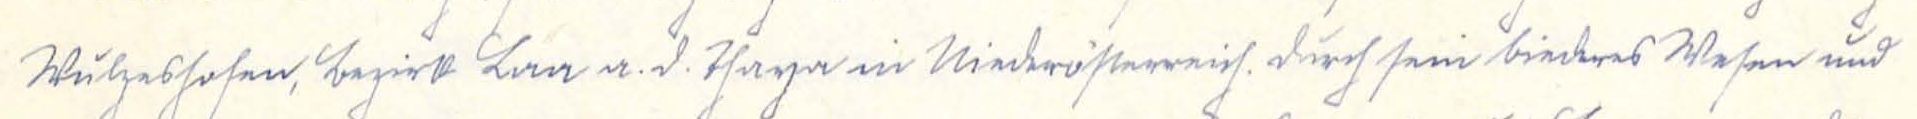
Wulzeshofen, Bezirk Laa a.d. Thaya in Niederösterreich. Durch sein biederes Wesen und
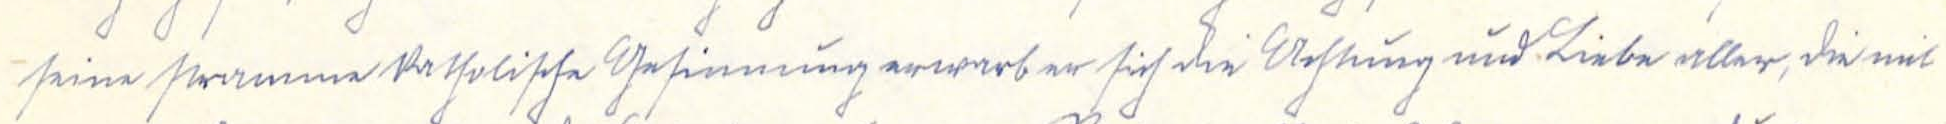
seine stramme katholische Gesinnung erwarb er sich die Achtung und Liebe aller, die mit
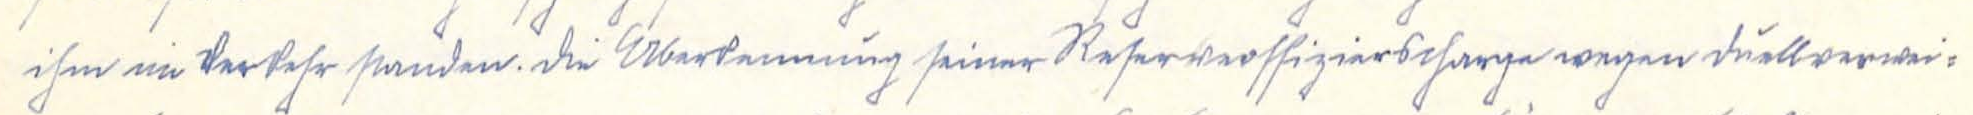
ihm im Verkehr standen. Die Aberkennung seiner Reserveoffizierscharge wegen Duellverwei-
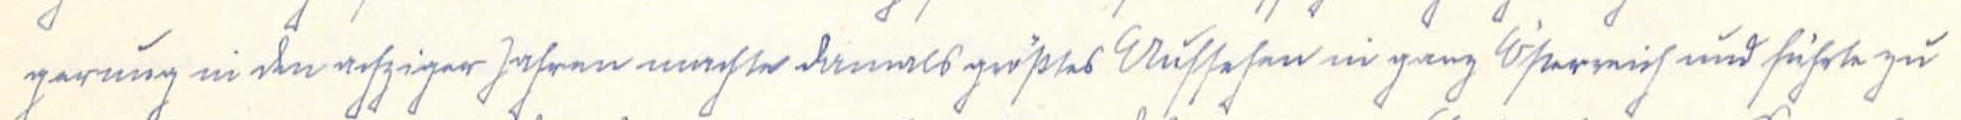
gerung in den achziger Jahren machte damals größtes Aufsehen in ganz Österreich und führte zu
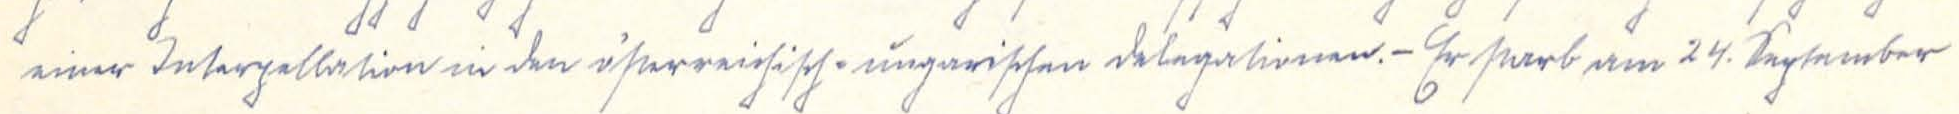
einer Interpellation in den österreichisch-ungarischen Delegationen.- Er starb am 24. September
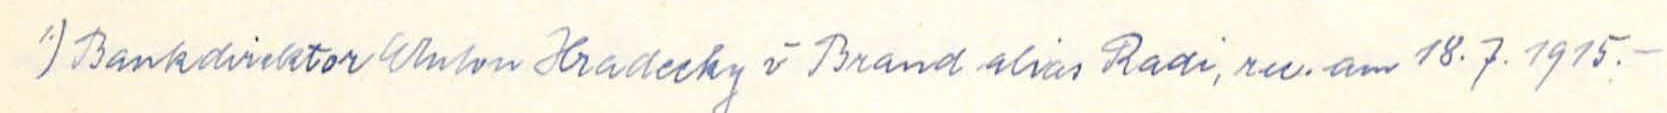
1.) Bankdirektor Anton Hradecky v/o Brand alias Radi, rec. am 18. 7. 1915.-
